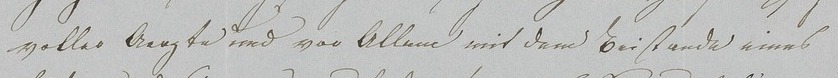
voller Aerzte und vor Allem mit dem Beistande eines
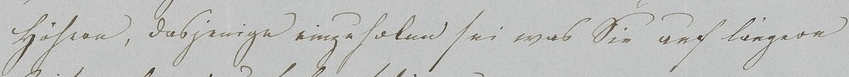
Höhern, dasjenige einzuholen sei was Sie auf längere
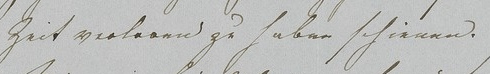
Zeit verloren zu haben schienen.
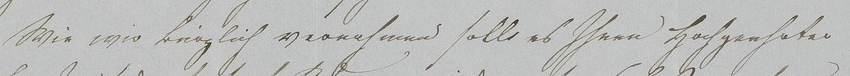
Wie wir kürzlich vernahmen soll es Ihnen Hochgeehrter
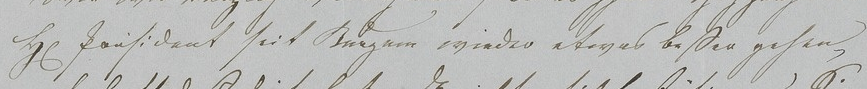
Herr Präsident seit Kurzem wieder etwas beßer gehen,
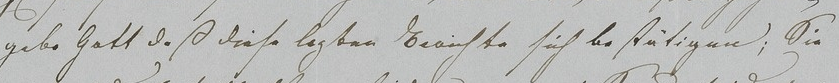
gebe Gott daß diese lezten Berichte sich bestätigen; Sie
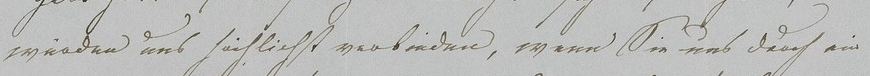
würden uns höchlichst verbinden, wenn Sie uns durch ein
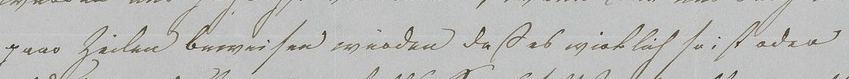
paar Zeilen beweisen würden daß es wirklich so ist oder
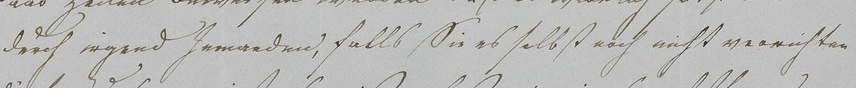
durch irgend Jemanden, falls Sie es selbst noch nicht verrichten
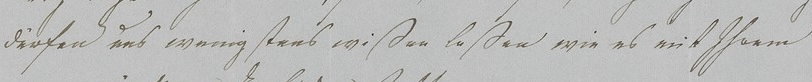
dürfen uns wenigstens wißen laßen wie es mit Ihrem
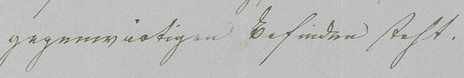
gegenwärtigen Befinden steht.
